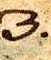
3.
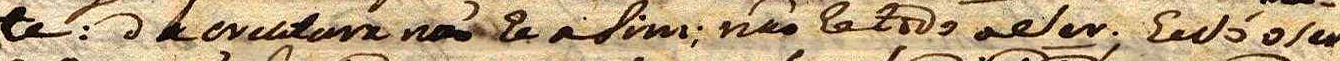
te: da creatura naõ he asim; não he todo o ser; he só o ser
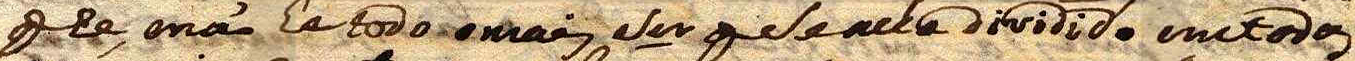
q̄ he, e naõ he todo o mais ser q̄ se acha dividido em todas
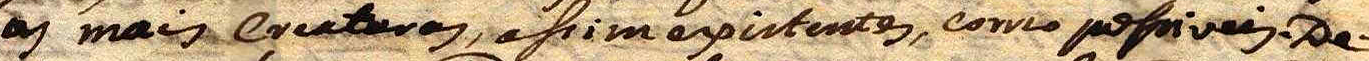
as mais creaturas, assim existentes, como possiveis. De
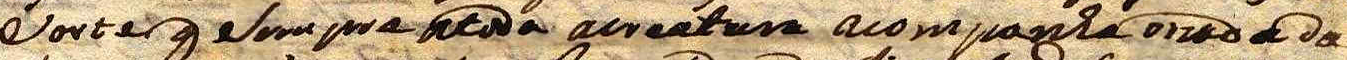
sorte q̄ sempre a toda a creatura acompanha o nada da
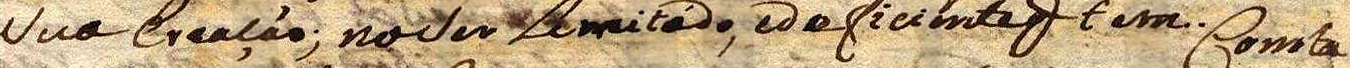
sua creação; no ser Lemitado, e deficiente q̄ tem. Consta
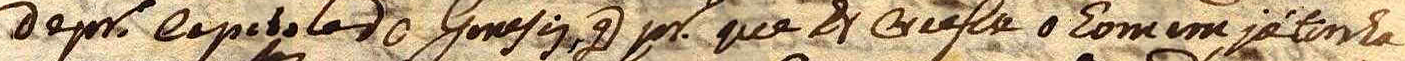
de pr.o capetolo do Genesis, q̄ pr.o que Ds. Creasse o homem já tinha
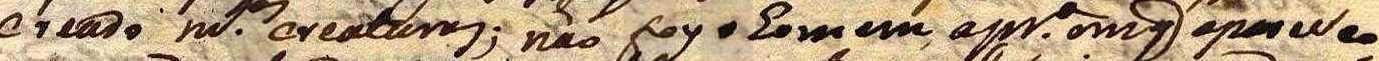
creado m.tas creaturas; naõ foy o homem, o pr.o em q̄ apareseo
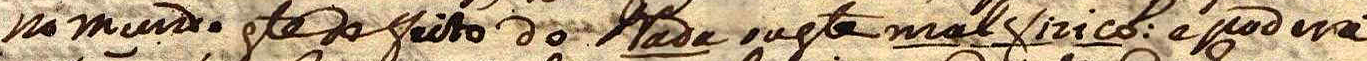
no mundo este defeito do Nada ou este mal fizico: e poderá
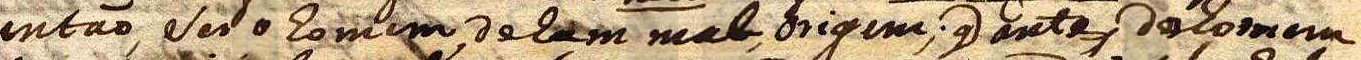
então, ser o homem, de hum mal, origem; q̄ antes do homem
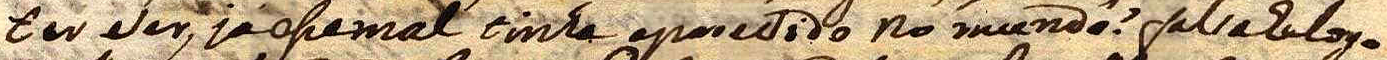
ter ser, já esse mal tinha aparesido no mundo? falsa he logo
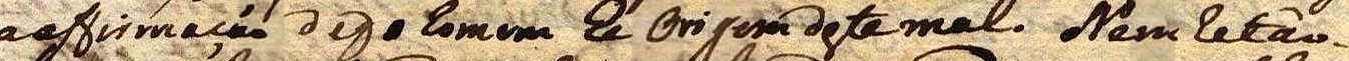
a affirmação de q̄ o homem he Origem deste mal. Nem he tão
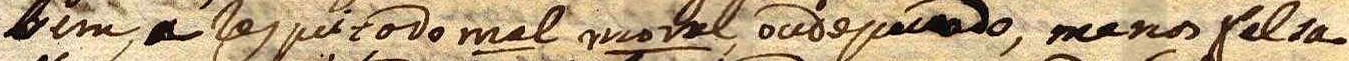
bem, a Respeito do mal moral, ou de peccado, menos falsa
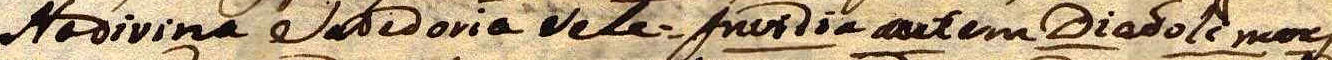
Na divina sabedoria dele = Jnuidia autem Diaboli mors
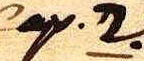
Cap.2.
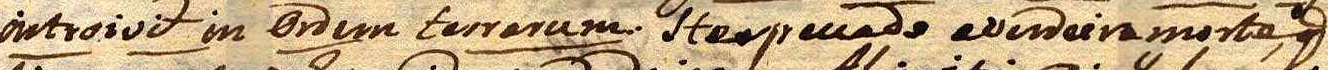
introivit in ordem terrarum. Iten peccado a verdeira morte, q̄
